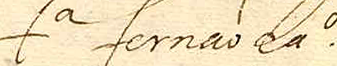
ta fernaõo dao.
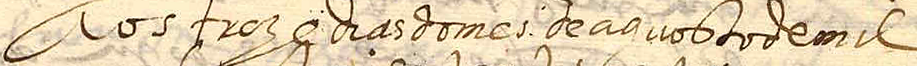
Aos treze dias do mes de aguosto de mil
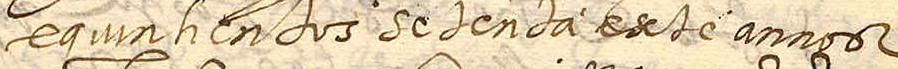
e quinhentos setenta e sete annos
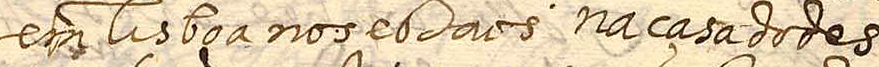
em lisboa nos estaos na casa do des
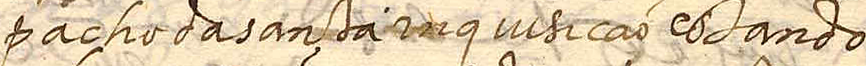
pacho da santa inquisicaõ estando
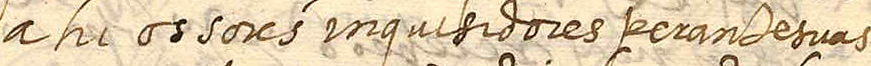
ahi os sores̄ inquisidores perante suas
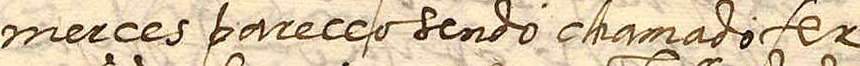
merces pareceo sendo chamado fer
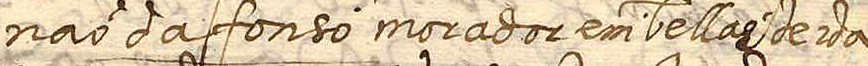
naõ dafonso morador em bellas de ida
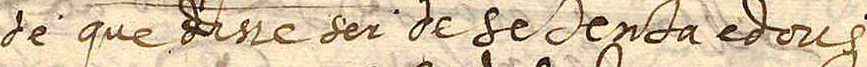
de que disse ser de setenta e dous
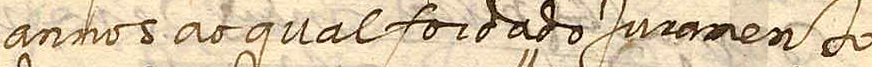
annos ao qual foi dado Juramento
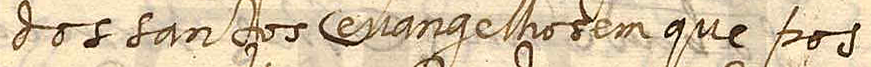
dos santos euangelhos em que pos
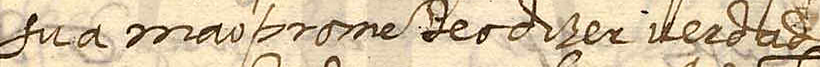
sua mao prometeo dizer uerdade
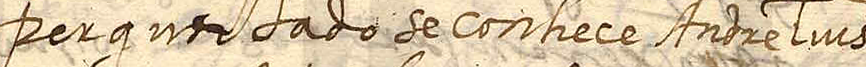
perguntado se conhece Andre Luis
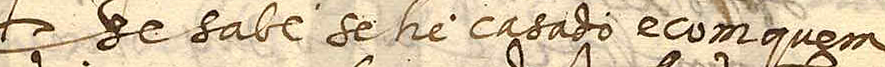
e se sabe se he casado e com quem
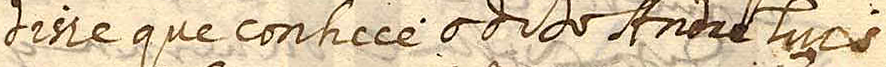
disse que conhece o dito Andre Luis
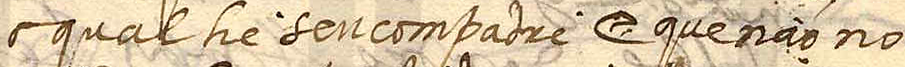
o qual he seu compadre e que naõ no
